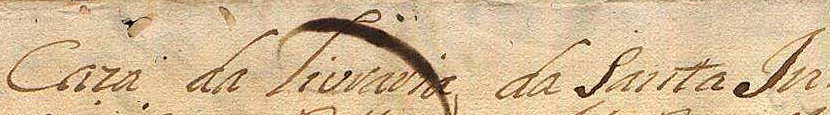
Caza da Livraria da Santa In
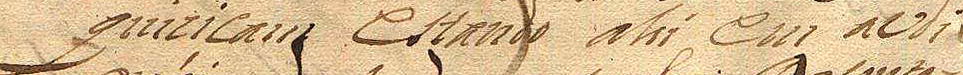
quiziçam estando ahi em avdi
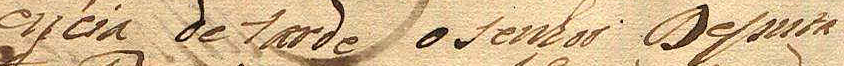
encia de tarde o senhor Deputa
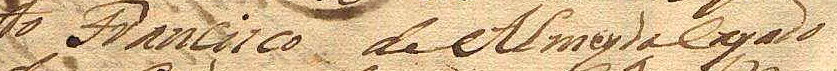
do Francisco de Almeyda Cayado
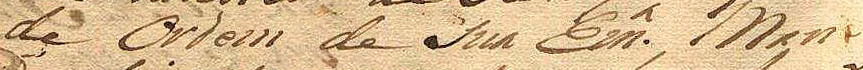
de Ordem de Sua Ema. Man
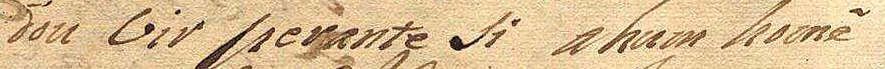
dou vir perante si a hum homē
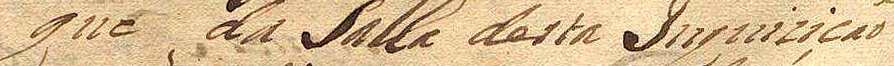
que da Salla desta Inquiziçaõ
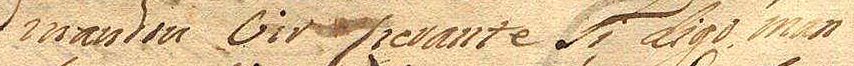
mandou vir perante si, digo, man
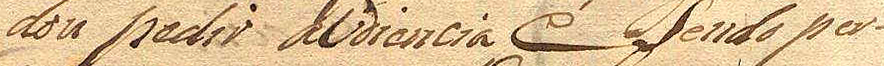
dou pedir avdiencia e sendo per
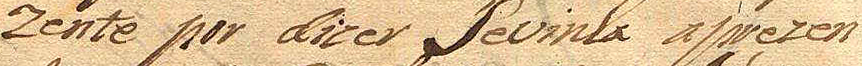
zente por dizer se vinha aprezen
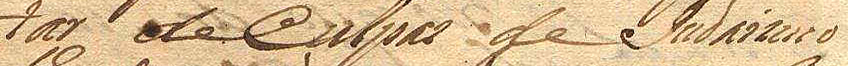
tar de Culpas de Iudaismo
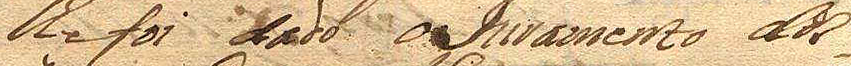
lhe foi dado o Iuramento dos
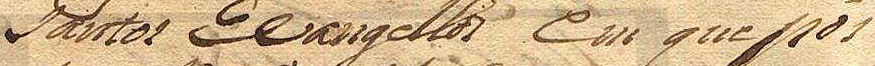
santos Evangelhos em que pos
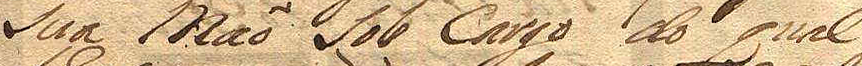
sua maõ sob cargo do qual
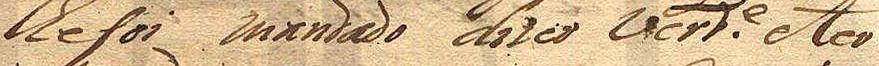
lhe foi mandado dizer verd.e e ter
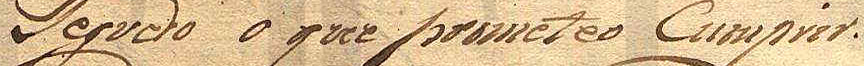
segredo o que prometeo cumprir.
